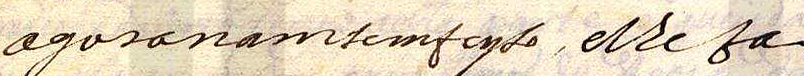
agora nam tem feyto e lhe fa
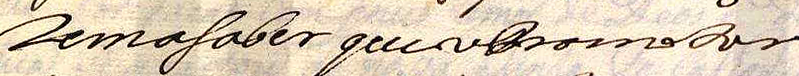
Zem a saber que o Promotor
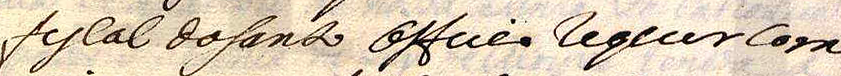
fisCal do santo officio Requer com
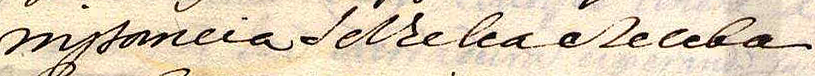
instancia se lhe lea e Receba
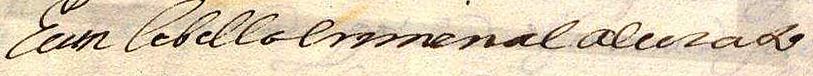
hum lebello criminal acuzato
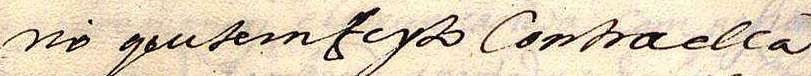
rio que tem feyto Contra ella
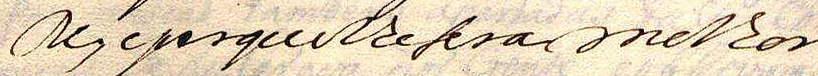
Re, e porque lhe sera melhor
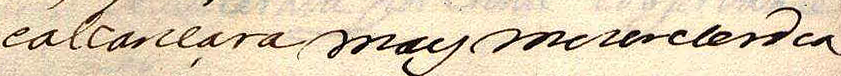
e alcançara maes mezerecordia
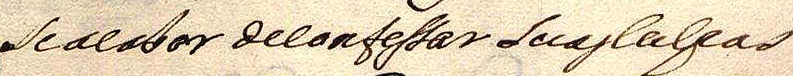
se acabar de confessar suas Culpas
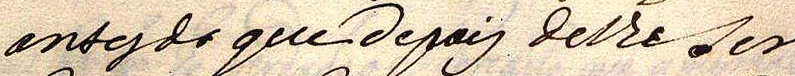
antes do que depois de lhe ser
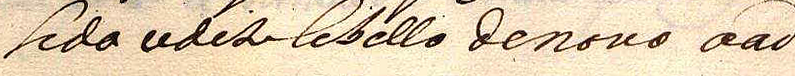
Lido o dito lebello de nouo o ad
